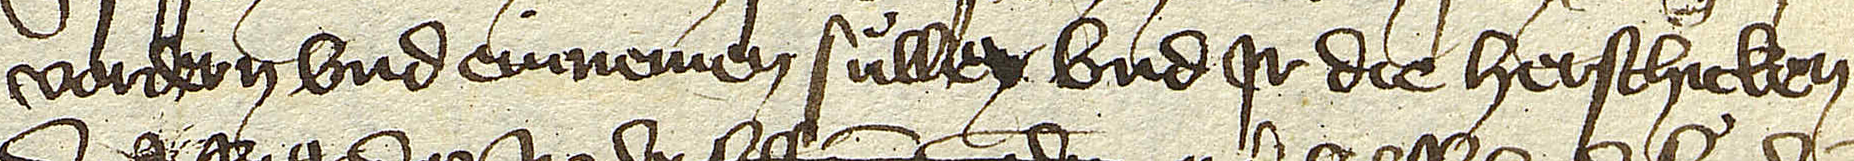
vordren vnd einnemen ſüllen vnd Ir die herſchicken
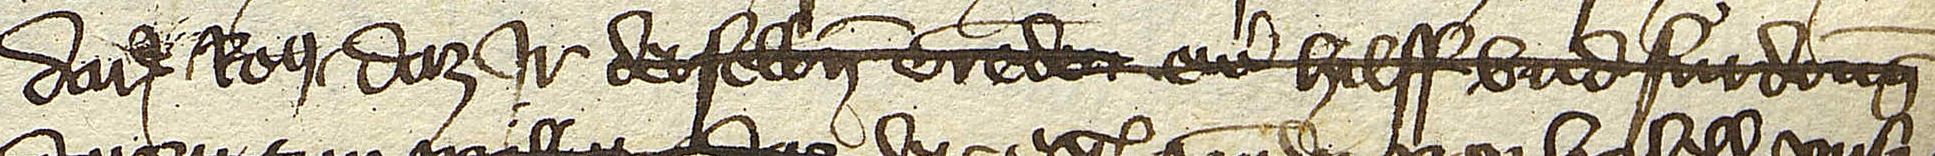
Dar* Ro* / daʒ Ir derſelbn* Greden ew* hilff vnd fürdrug*
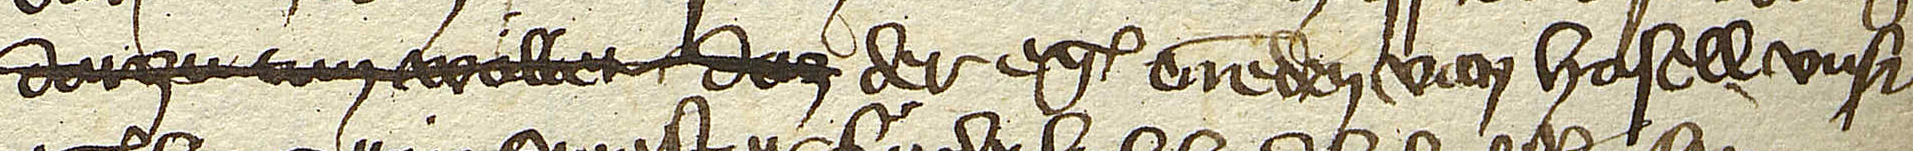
darcʒu tun wöllet / daʒ der eg* Greden von hoſell vnſ*r
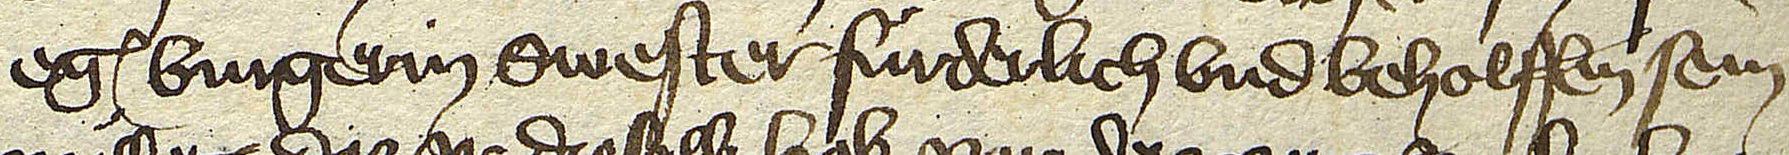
eg* burgerin Sweſter fürderlich vnd beholffen ſein
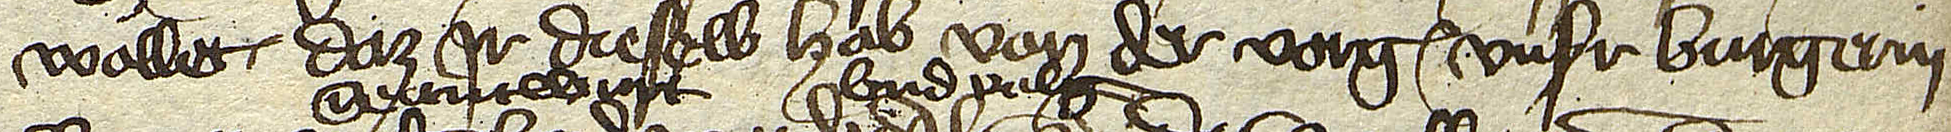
wöllet / daʒ Ir dieſelb hab von der vorg* vnſ*r burgerin
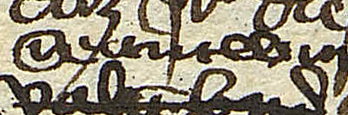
geantwurt
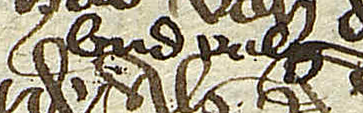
vnd volg
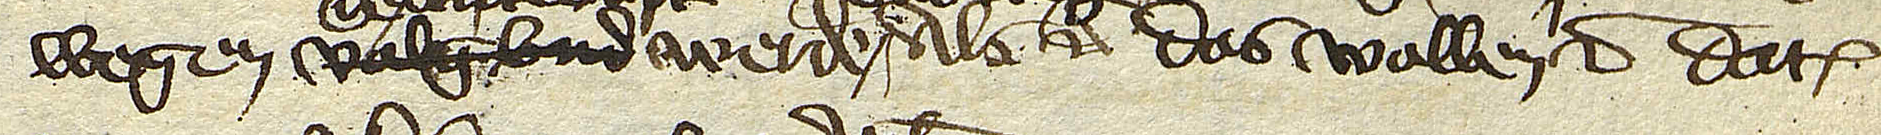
wegen volg vnd werde / Als ec* das wollen ec* dat*
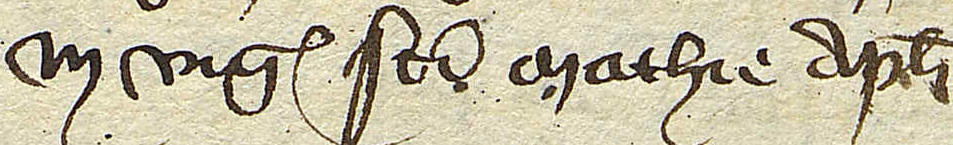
in vig* ſci* Mathie Apli*
